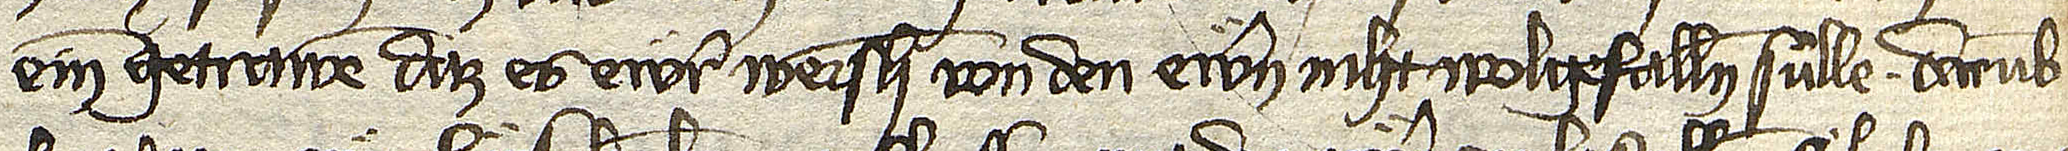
ein* getrawe* daʒ es eẅr* weiſh* von den eẅ*n niht wolgefalln* ſülle . Darub*
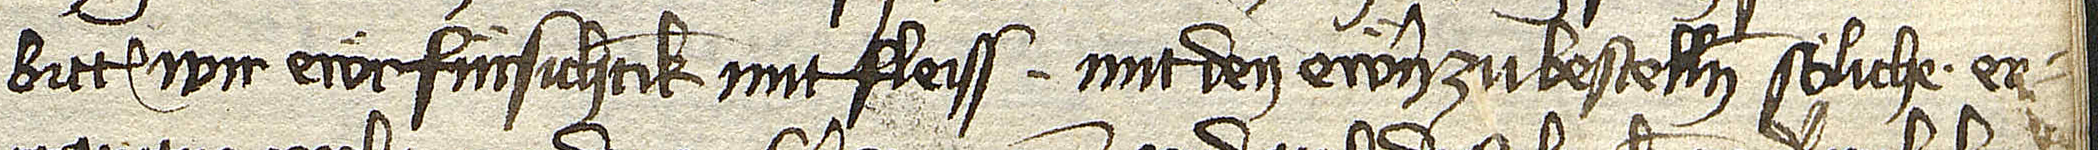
bitt* wir eẅr fürſichtik* mit fleiſſ . mit den eẅ*n ʒu beſtelln* ſöliche . er =
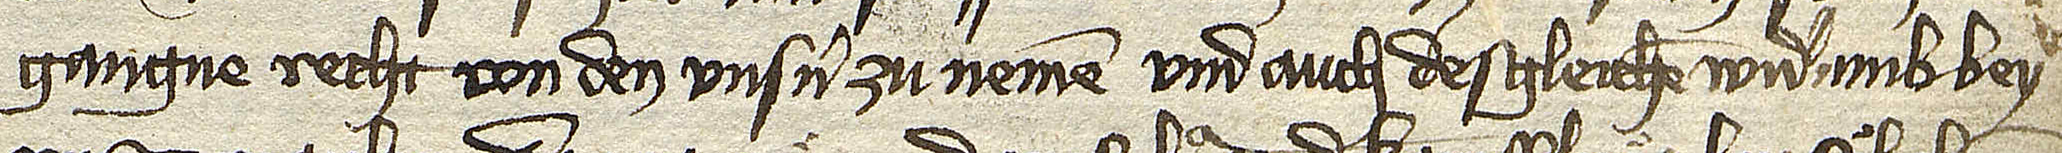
gangne recht von den vnſn* ʒu neme* vnd auch deſgleiche* wid*umb bey
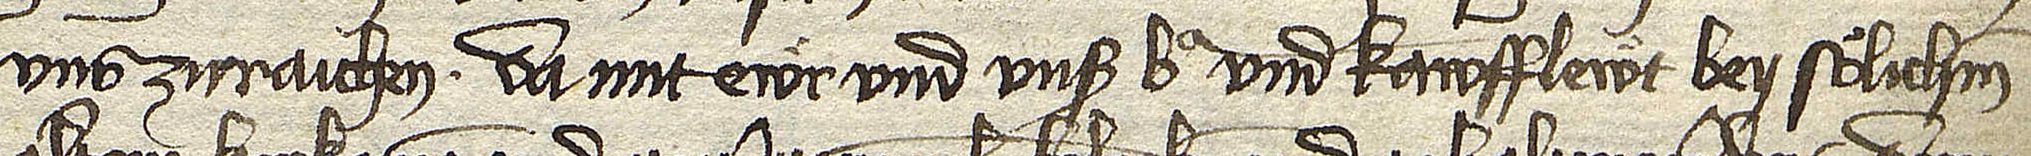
vns ʒu raichen . Da mit eẅr vnd vnſ* b* vnd kawffleẅt bey ſölichm*
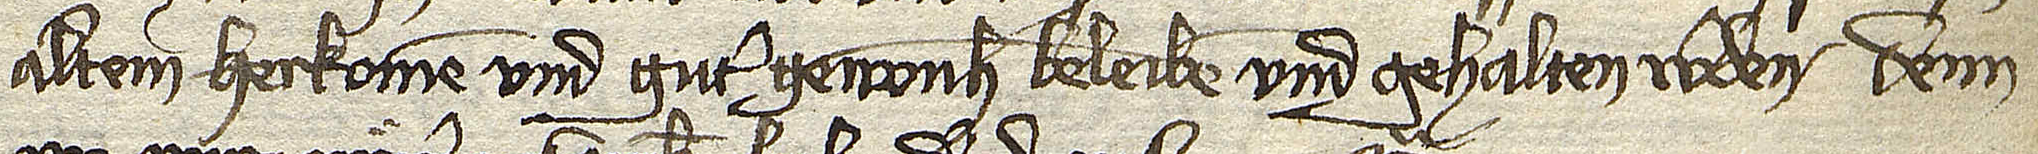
altem herkome* vnd gut* gewonh* beleibe* vnd gehalten w*den / Denn
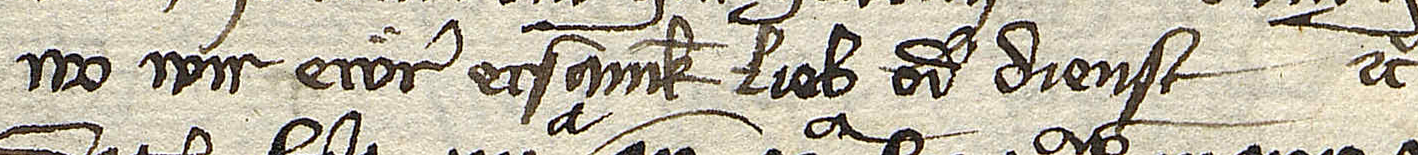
wo wir eẅr* erſamk* lieb od* dienſt ec*
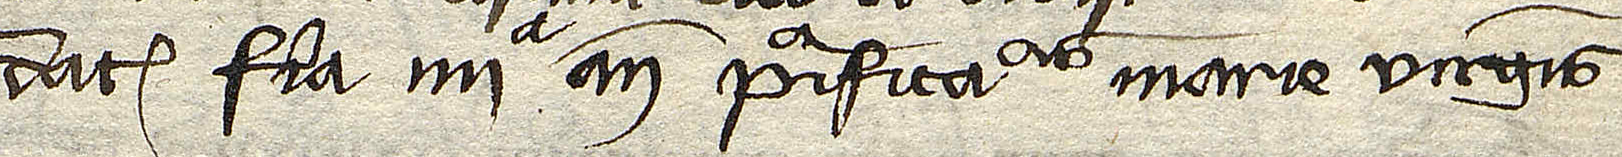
Dat* fi*a iiii* an* p*ifica* marie virg*is
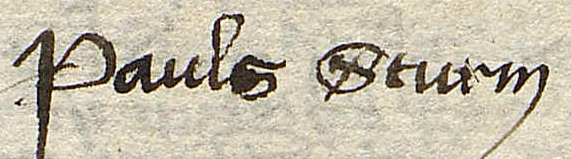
Pauls Sturm
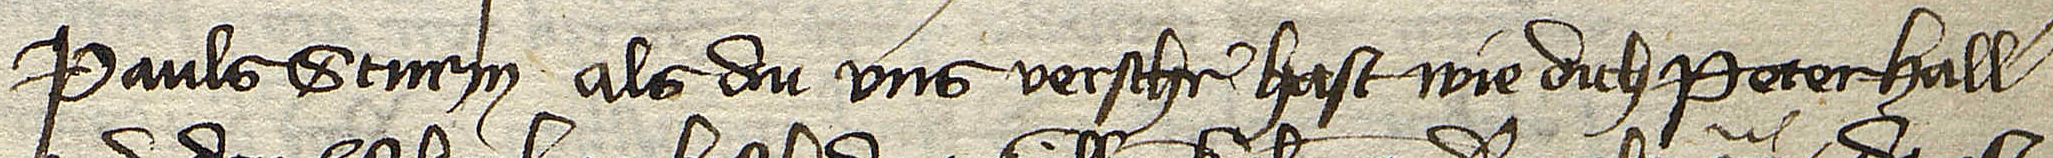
Pauls Sturm als du vns verſchr* haſt wie dich Peter hall*
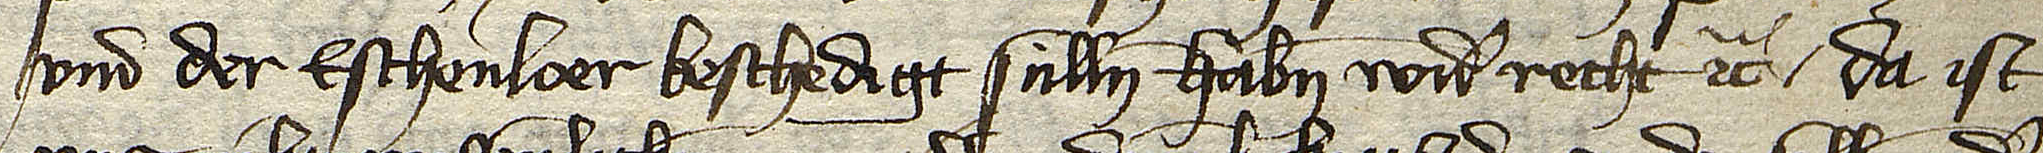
vnd der Eſchenloer beſchedigt ſülln* habn* wid* recht ec* / da iſt
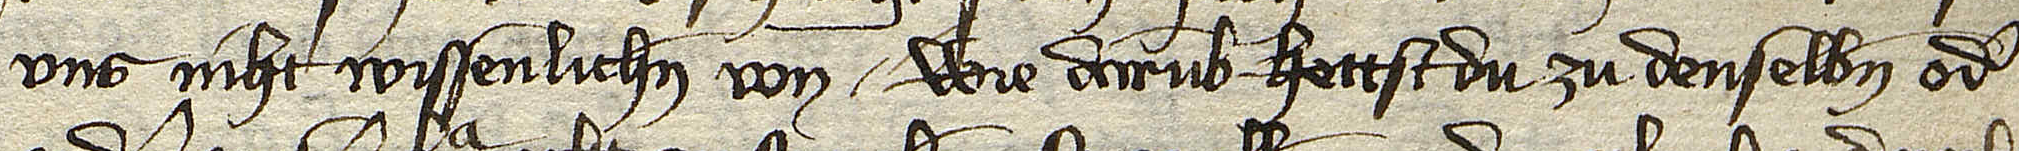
vns niht wiſſenlichn* von / wie darub* hettſt du ʒu denſelbn* od*
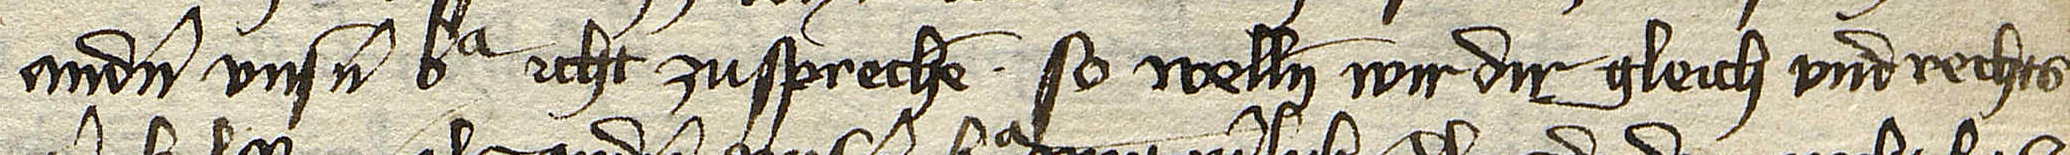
andn* vnſn* b* icht ʒuſpreche* . ſo welln* wir dir gleich vnd rechts
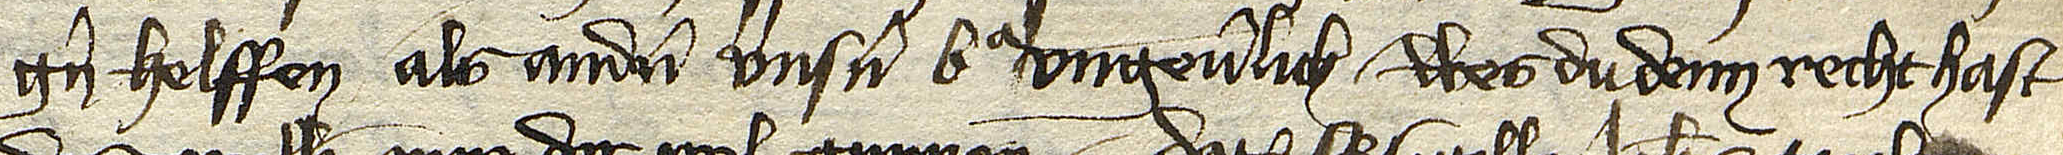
g*n helffen als andn* vnſn* b* vngeu*lich / wes du denn recht haſt
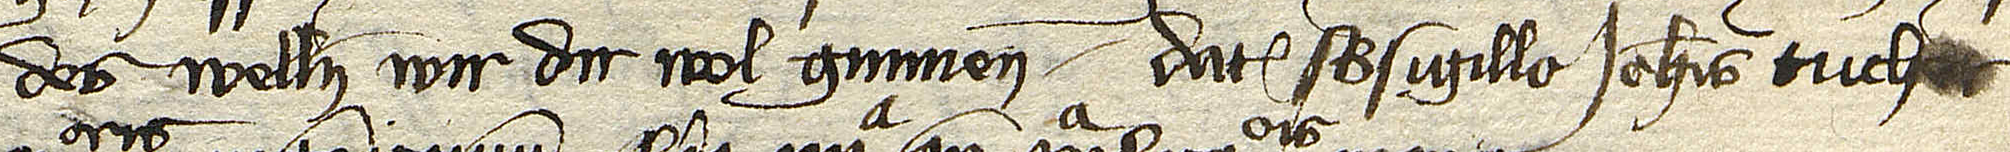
des welln* wir dir wol gunnen / dat* ſ* ſigillo Ioh*is tucher
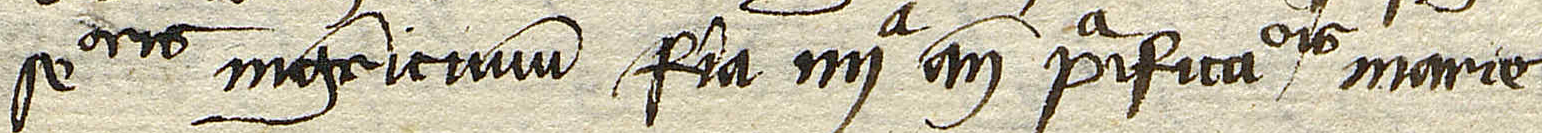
ſe* m*gricuiu* / fi*a iiii* an* p*ifica* marie
